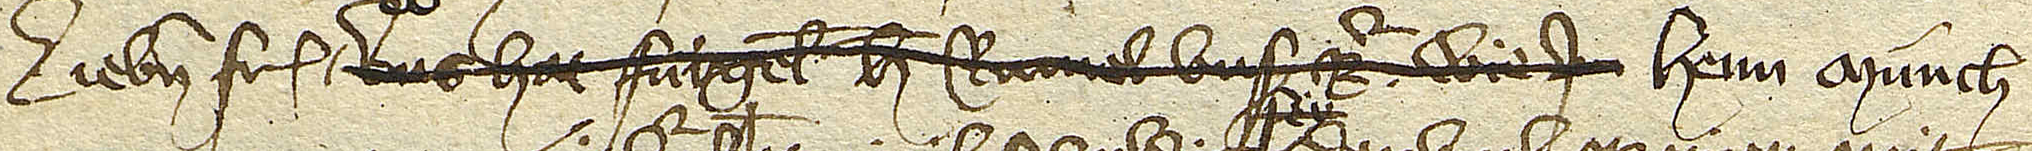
Liebn* fr* / Vns hat fürgel* h* Rumel vnſ* B* . wie Im he%% Münch
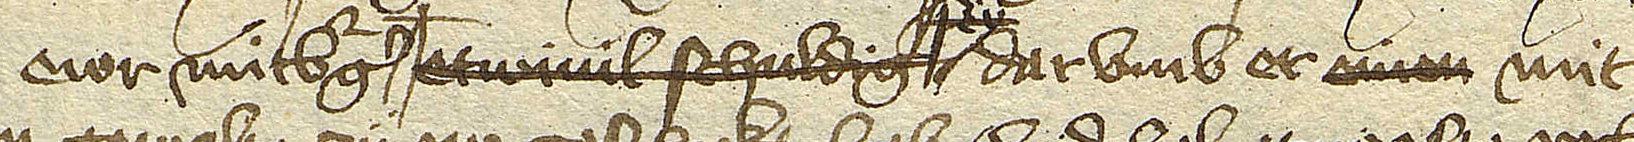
ewr mitb*g* etwiuil ſchuldig darvmb er einen mit
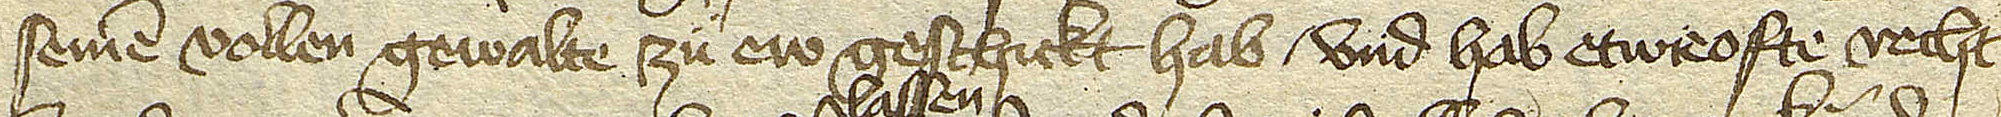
ſeine* vollen gewalte cʒü ew geſchickt hab / vnd hab etwieofte recht
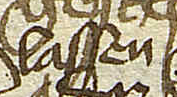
laſſen
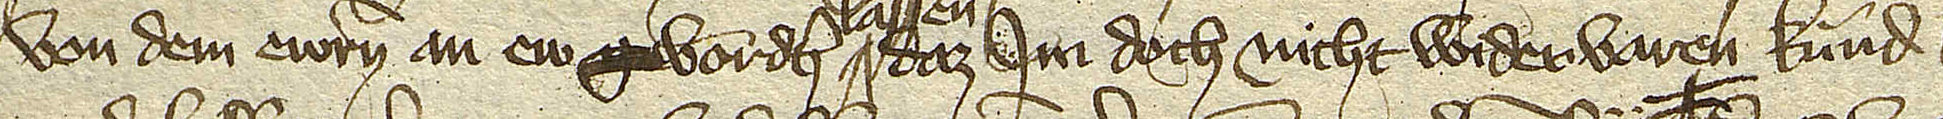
von dem ewr*n an ew gevordt* / daʒ Im doch nicht widervaren künd
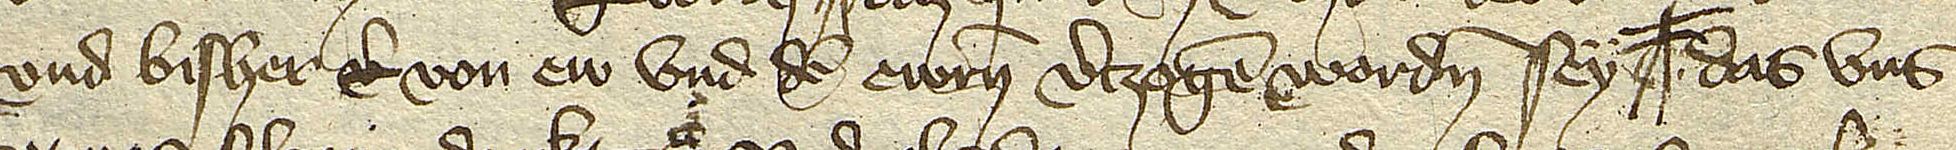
vnd biſher v* von ew vnd d* ewrn* v*cʒoge* wordn* ſey / . das vns
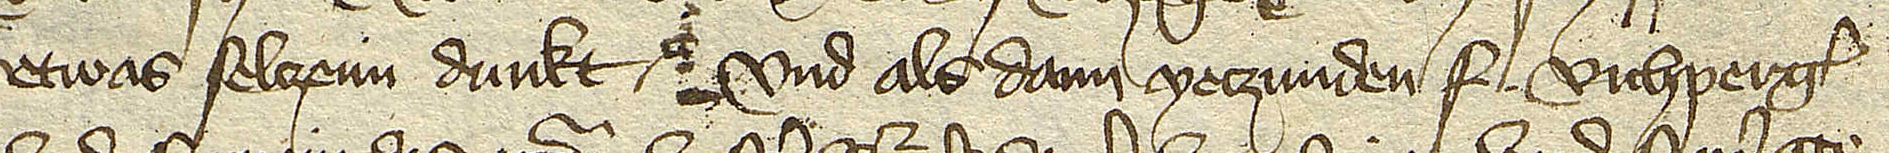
etwas ſelcʒeim dunkt / Vnd als dann yecʒunden f . Vichperg*
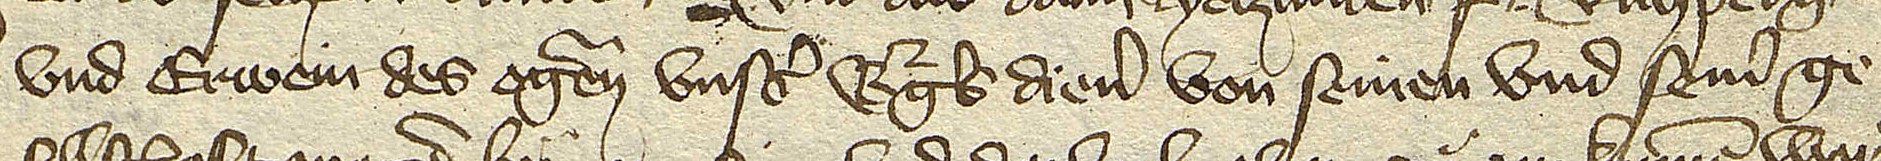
vnd Erwein des egen* vnſs* B*g*s dien* von ſeinen vnd ſein* ge
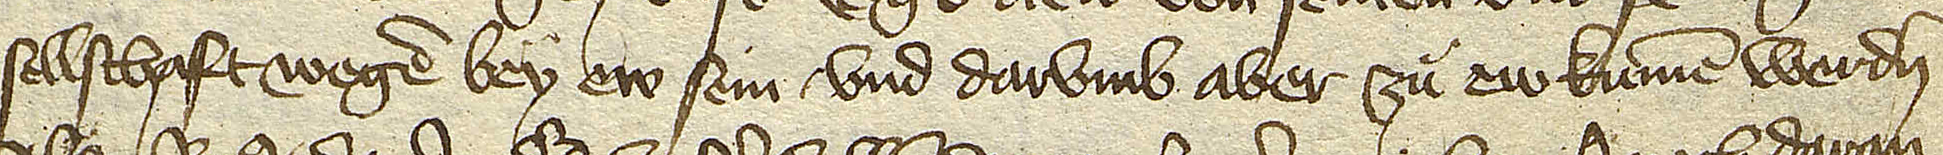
ſellſchaft wege* bey ew ſein / vnd darvmb aber cʒü ew kume* werdn*
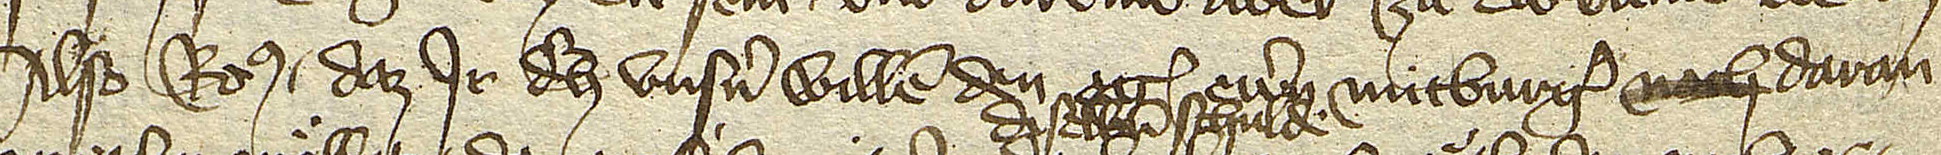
Alſo Ro* / daʒ Ir d*h vnſn* wille* den eg* ewn* mitburg* noch daran
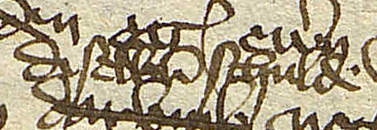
diſelbn* ſchulde
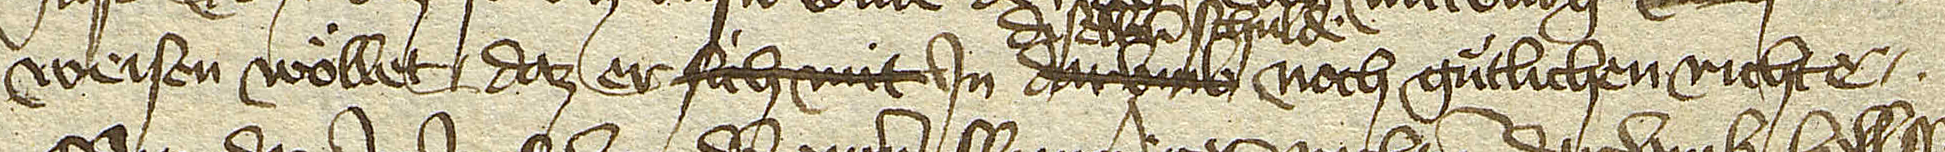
weiſen wöllet / daʒ er ſich mit In darvmb noch gütlichen richte / .
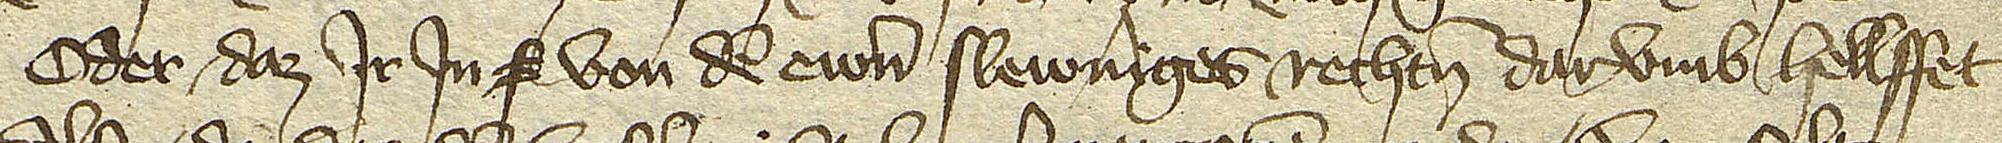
Oder / daʒ Ir In ſ von d* ewn* ſlewniges rechtn* darvmb hellffet
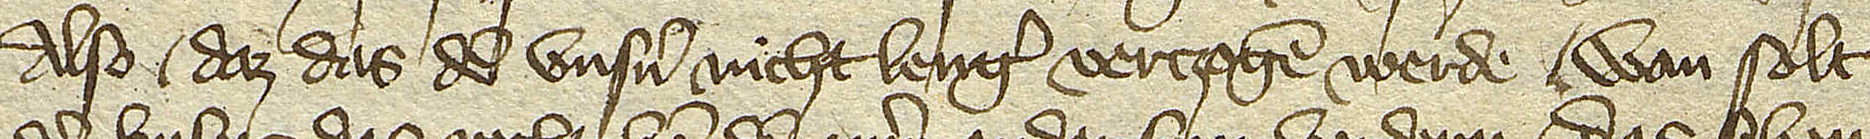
Alſo / daʒ das d* vnſn* nicht leng* vercʒoge* werde / wan ſolt
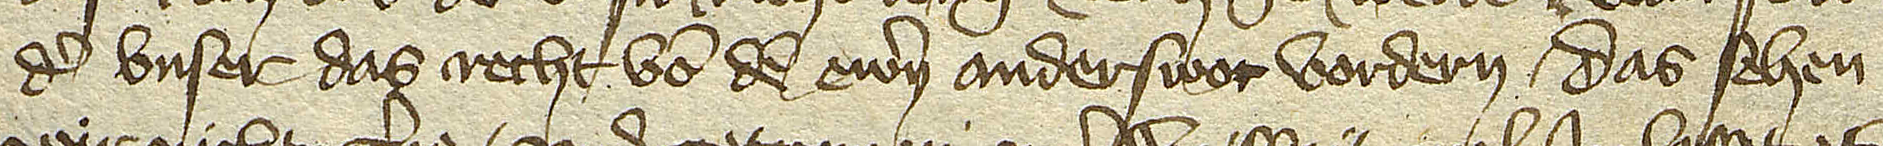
d* vnſer das recht vo* d* ew*n anderſwor vordern / Das ſehen
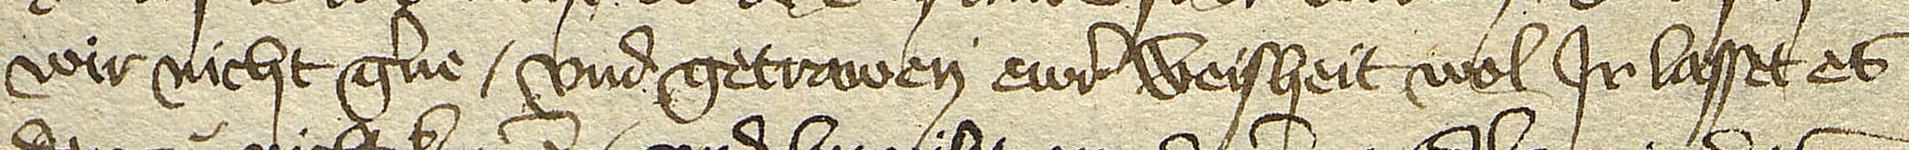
wir nicht g*ne / vnd getrawen ewr* weiſheit wol Ir laſſet es
